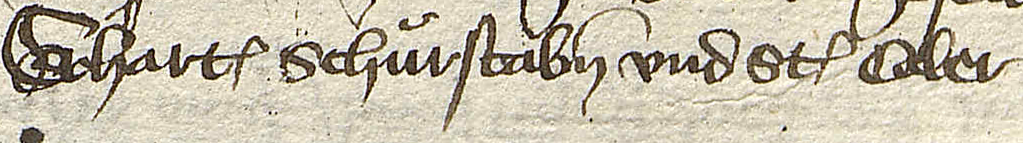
Erhart* Schürſtabn* vnd St* Coler
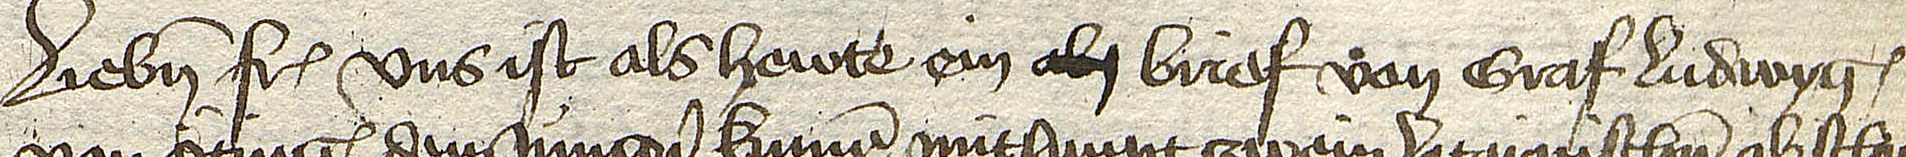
Liebn* fr* vns iſt als hewte ein abſ brief von Graf Ludwyg*
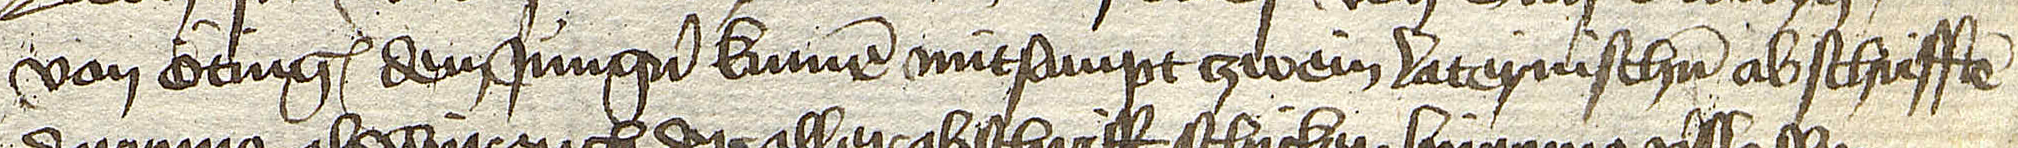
von Öting* dem Iüngn* kume* mitſampt cʒwein Latyniſchn* abſchriffte*
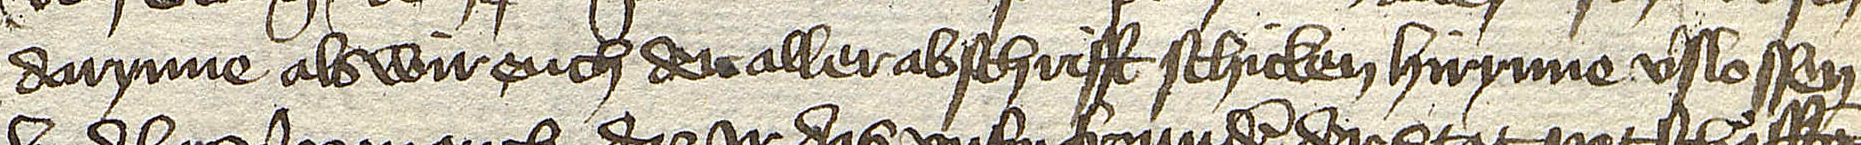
darynne als wir euch der aller abſchrifft ſchicken hirynne v*ſloſſen
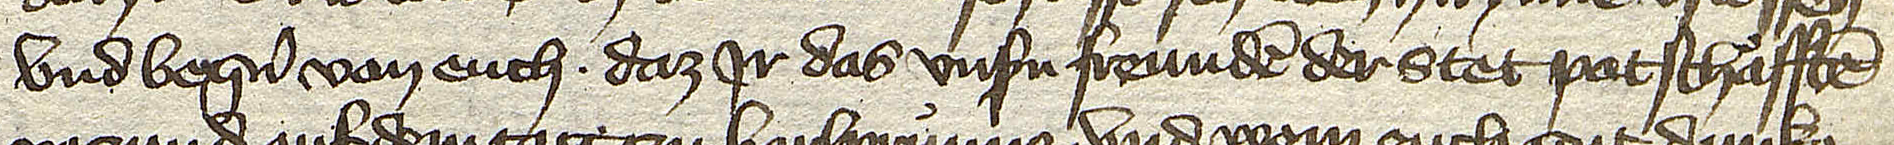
vnd begn* von euch . daʒ Ir das vnſ*n freunde* der Stet potſchäffte*
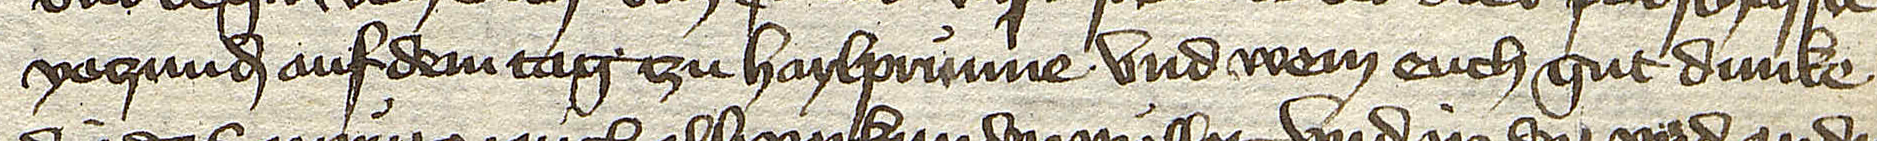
yecʒund* auf dem tag cʒu haylprünne . vnd wem euch gut dunke .
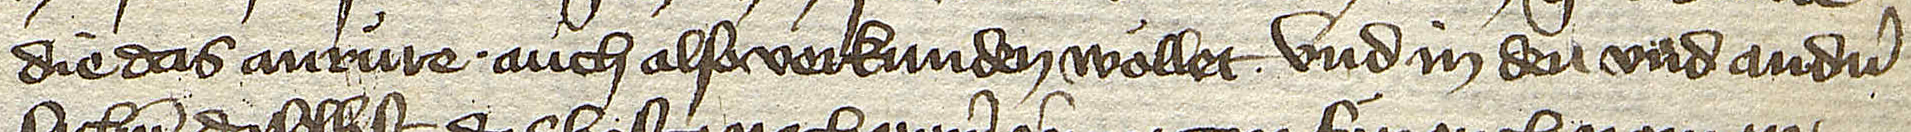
die das anrüre . auch alſo verkunden wöllet . vnd in den vnd andn*
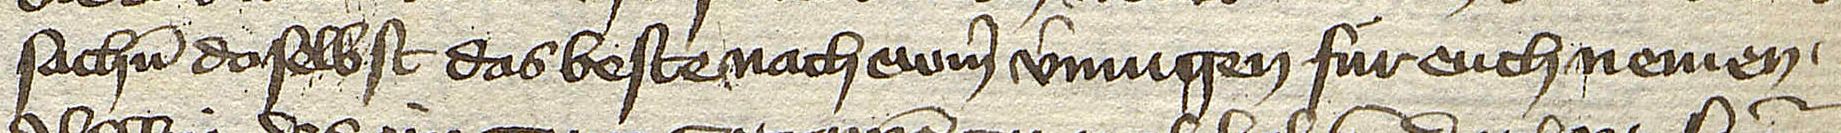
ſachn* doſelbſt das beſte nach ewm* v*nugen für euch nemen /
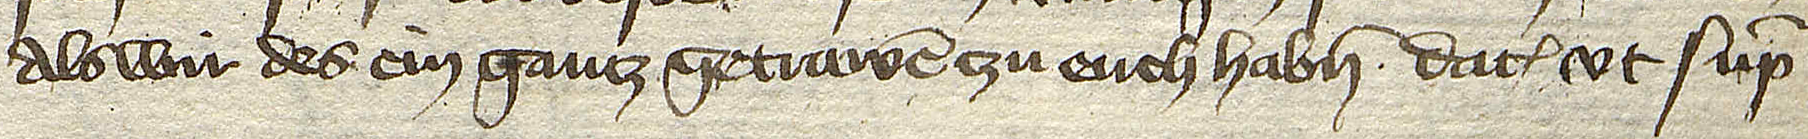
Als wir des ein gancʒ getrawe* cʒu euch habn* . dat* vt ſup*
